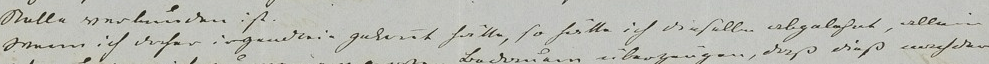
Wenn ich daher irgendwie gekonnt hätte, so hätte ich dieselbe abgeleget, allein
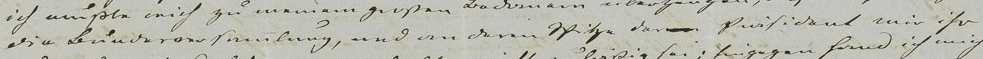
die Bundesversammlung, und an deren Spitze der Präsident mir ihr
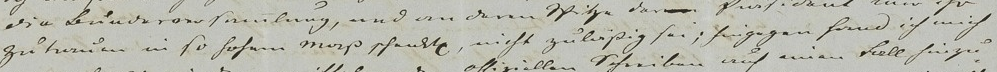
Zutrauen in so hohem Maß schenkte, nicht zuläßig sei; hingegen fand ich mich
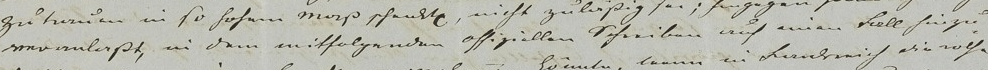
veranlaßt, in dem mitfolgenden offiziellen Schreiben auf einen Fall hinzu-
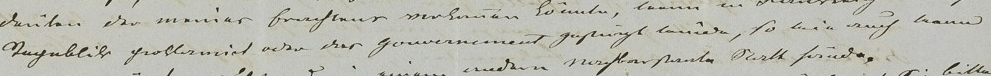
Republik proklamiert oder das Gouvernement gestürzt würde, so wie auch wenn
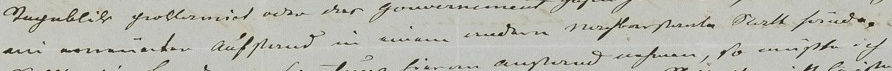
ein erneuer Aufstand in einem anderen Nachbarstaate Statt fände.
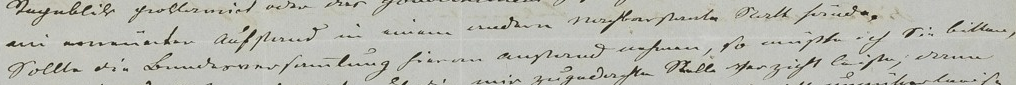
Sollte die Bundesversammlung hieran Anstand nehmen, so müßte ich Sie bitten,
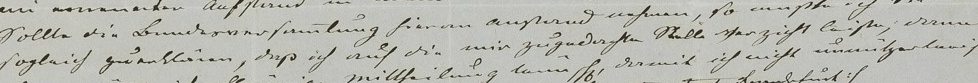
sogleich zu erklären, daß ich auf die mir zugedachte Stelle Verzicht leiste; dann
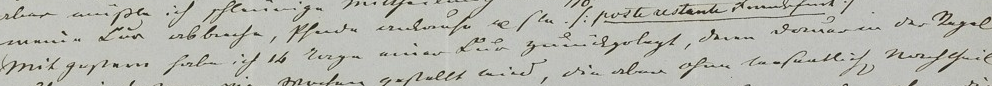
Mit gestern habe ich 14 Tage einer Cur zurückgelegt, deren Dauer in der Regel
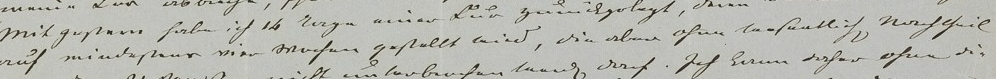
auf mindestens vier Wochen gestellt wird, die aber ohne wesentlichen Nachtheil
